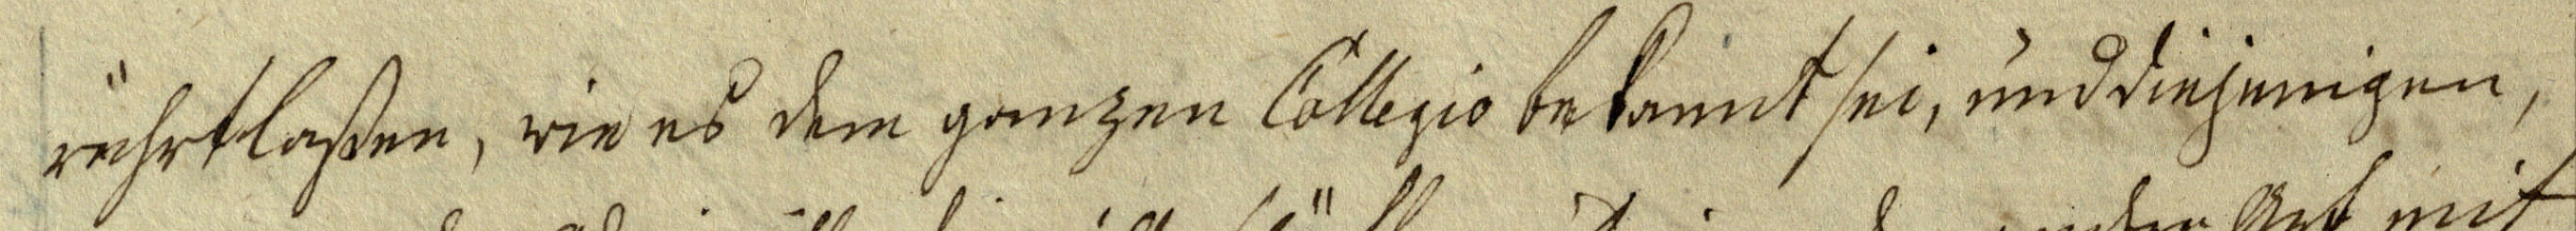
rührt laßen, wie es dem ganzen Collegio bekannt sei, und diejenigen,
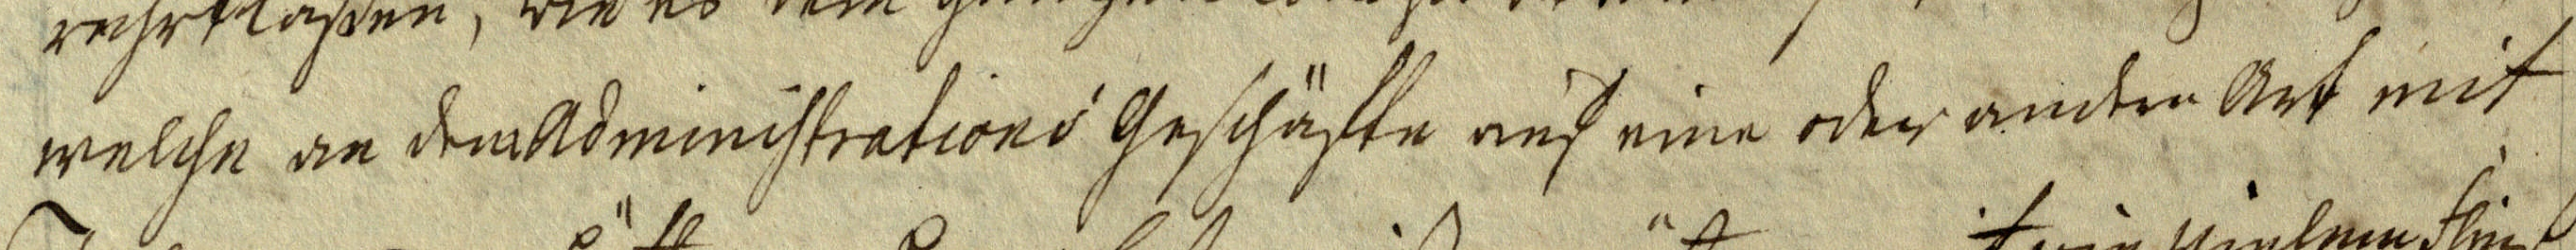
welche an dem Administrations Geschäfte auf eine oder andere Art mit
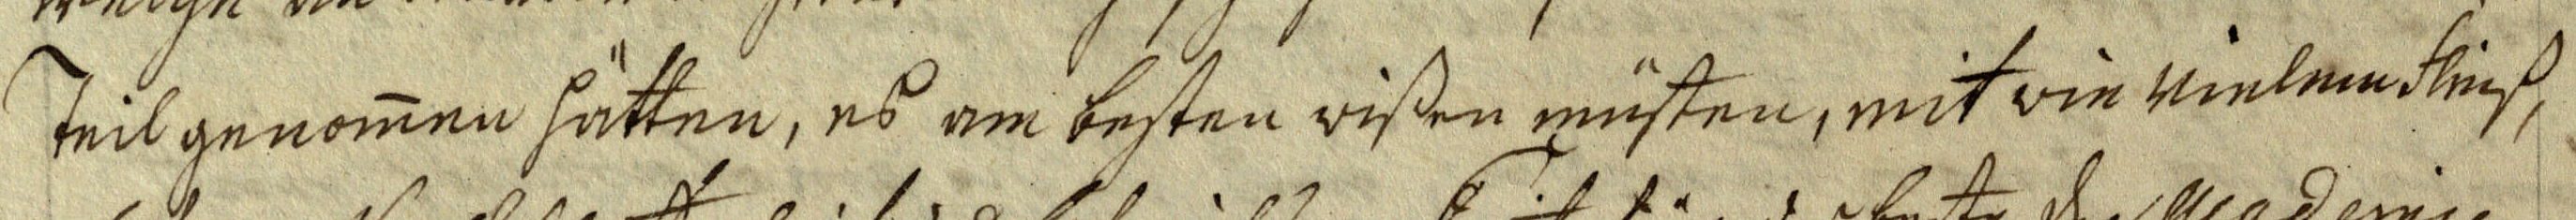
Teil genomen hätten, es am besten wißen müßten, mit wie vielem Fleiß
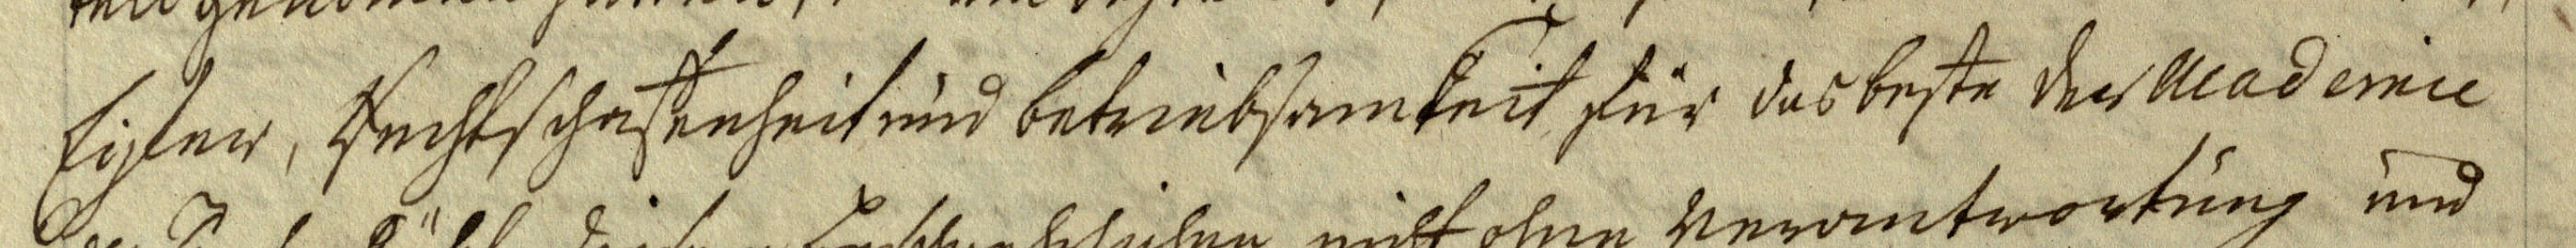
Eifer, Rechtschaffenheit und Betriebsamkeit für das beste der Academie
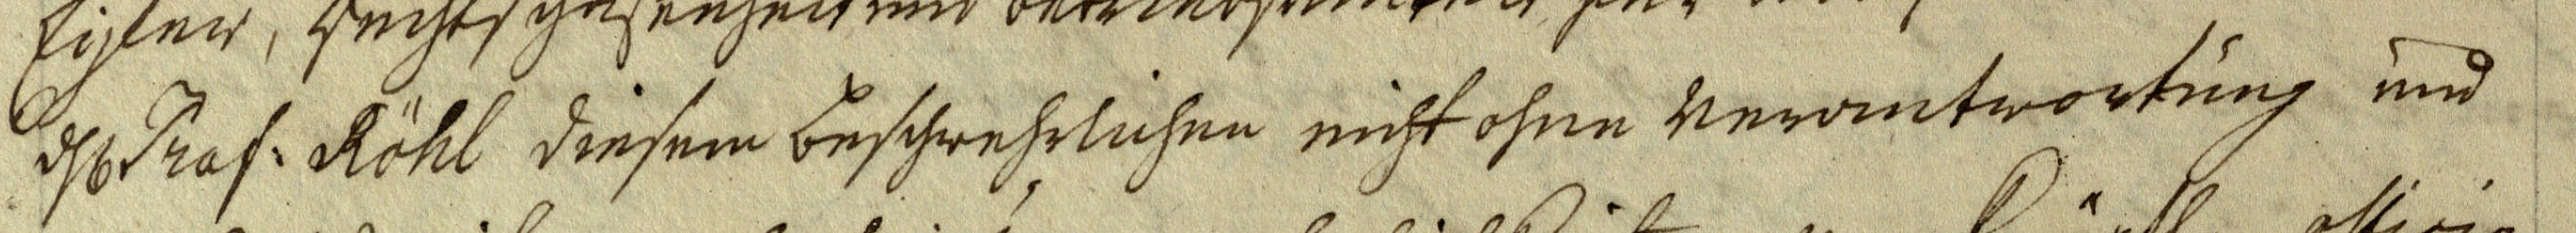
dh Prof. Röhl diesem beschwehrlichen nicht ohne Verantwortung und
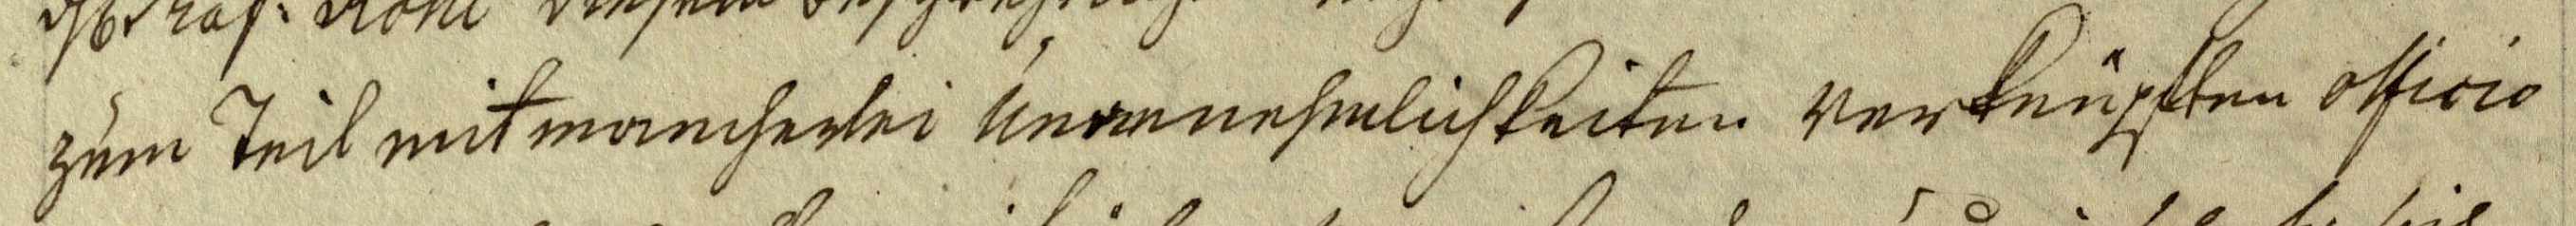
zum Teil mit mancherlei Unannehmlichkeiten verknüpften officio
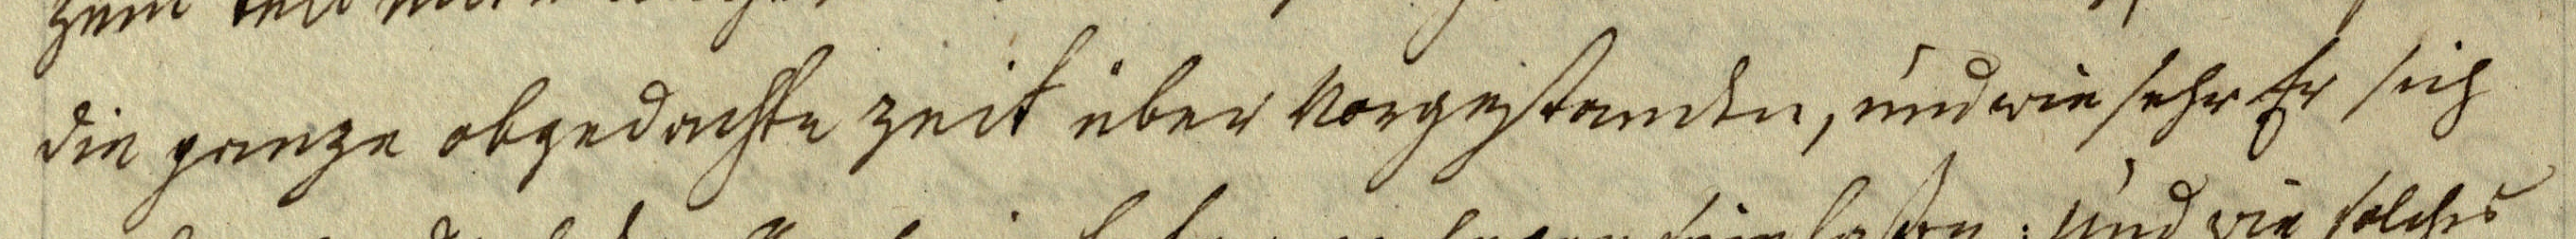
die ganze obgedachte Zeit über vorgestanden, und wie sehr Er sich
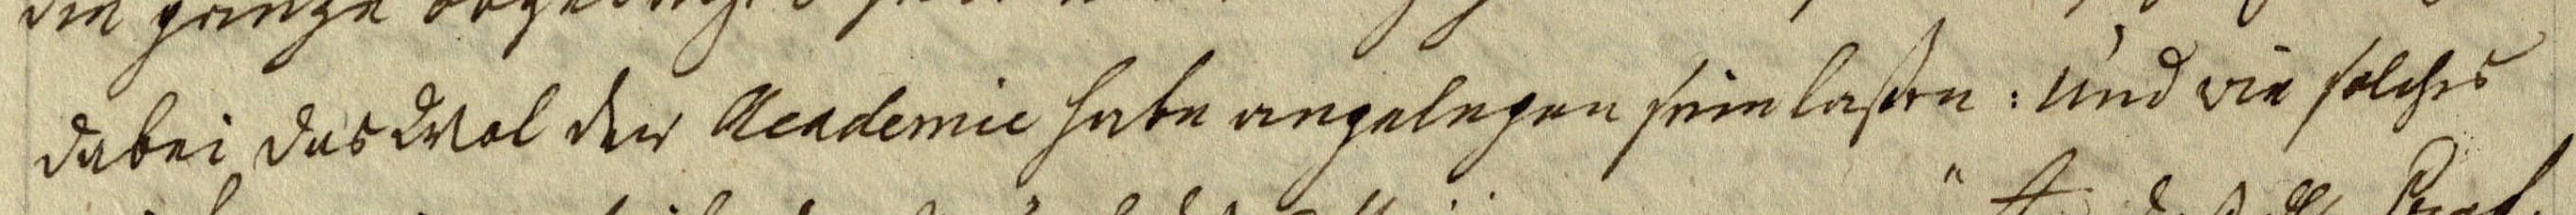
dabei das Wol der Academie habe angelegen sein laßen. Und wie solches
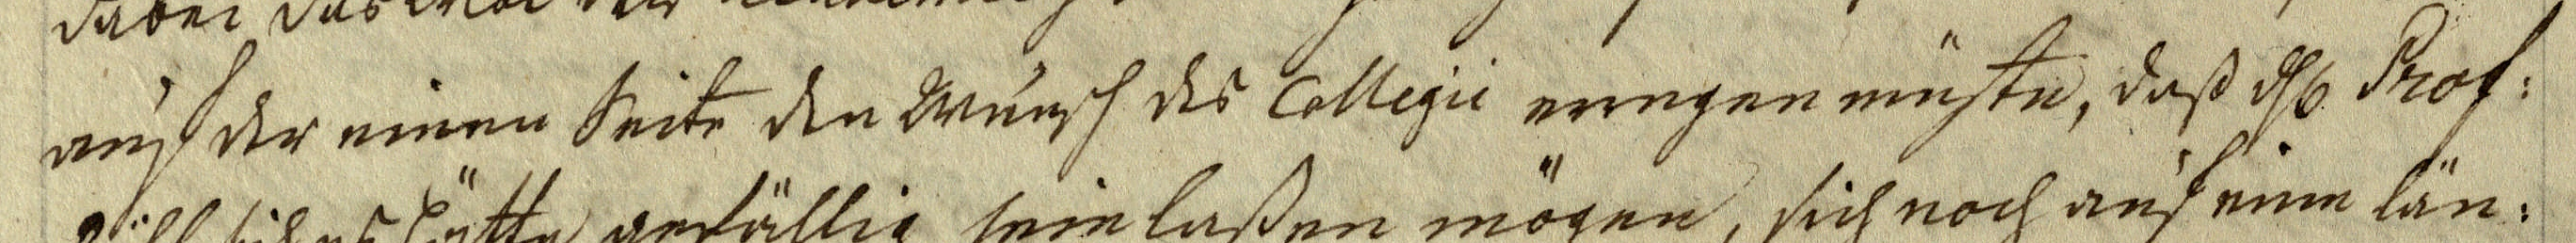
auf der einen Seite den Wunsch des Collegii erregen müßte, daß dh Prof.
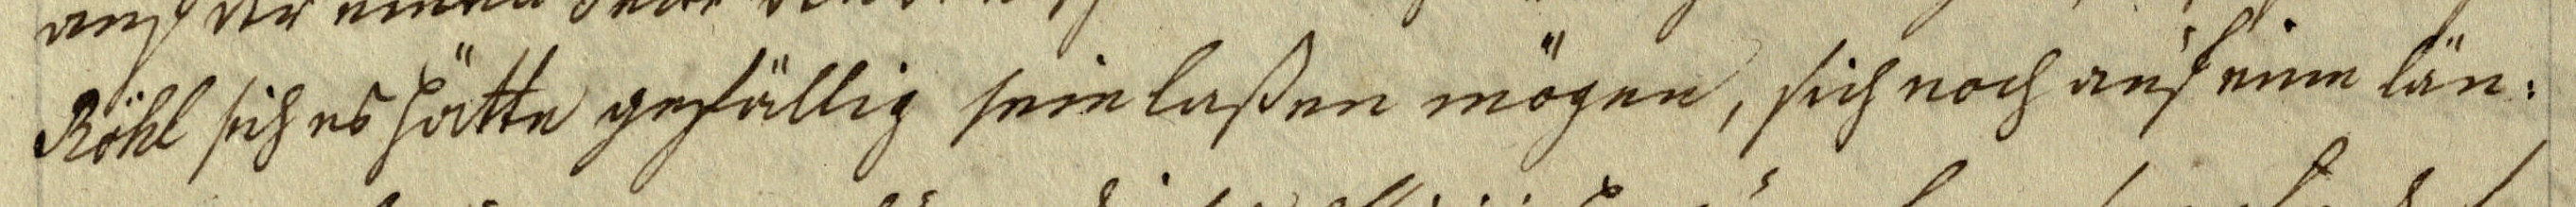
Röhl sich es hätte gefällig sein laßen mögen, sich noch auf eine län¬
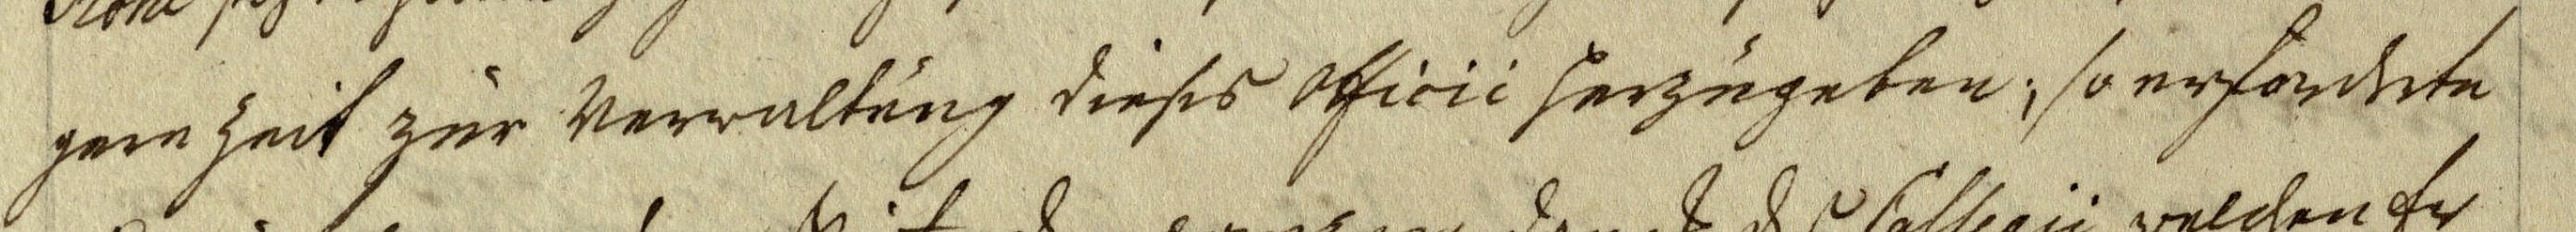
gere Zeit zur Verwaltung dieses officii herzugeben, so erforderte
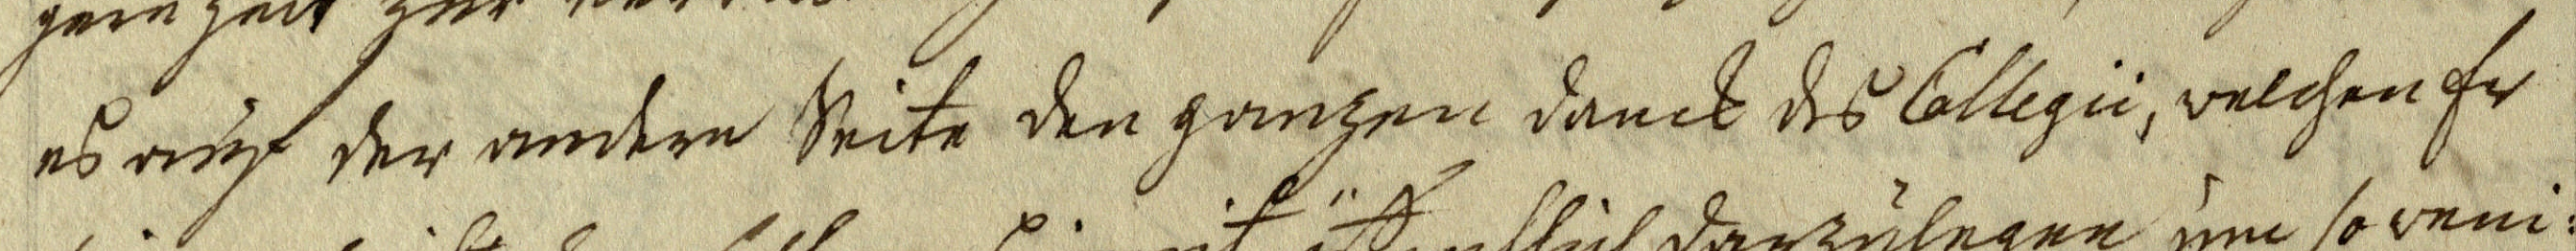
es auf der andern Seite den ganzen Dank des Collegii, welchen Er
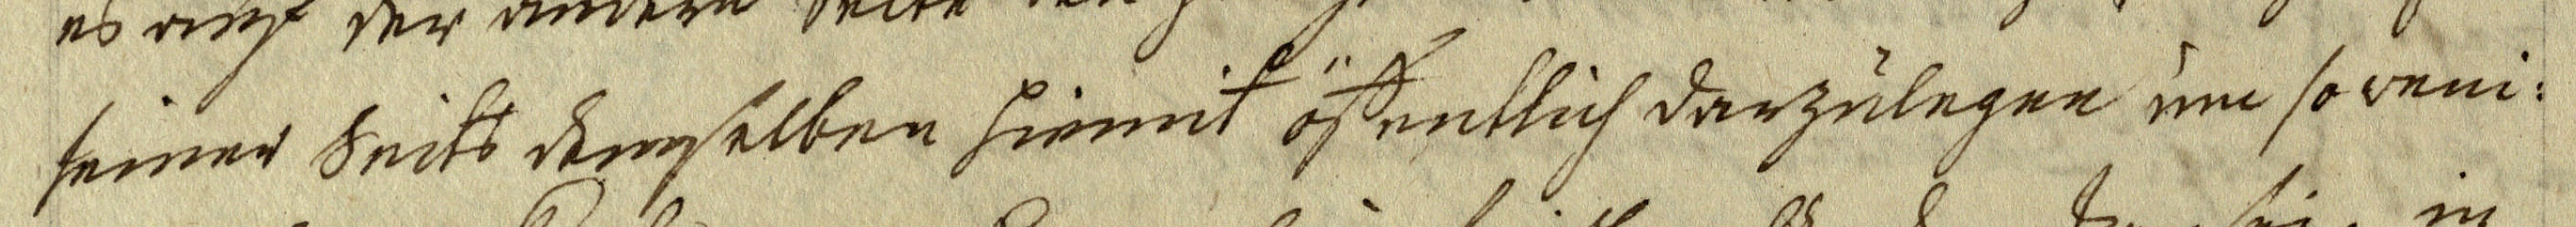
seiner Seits demselben hiemit öffentlich darzulegen um so weni¬
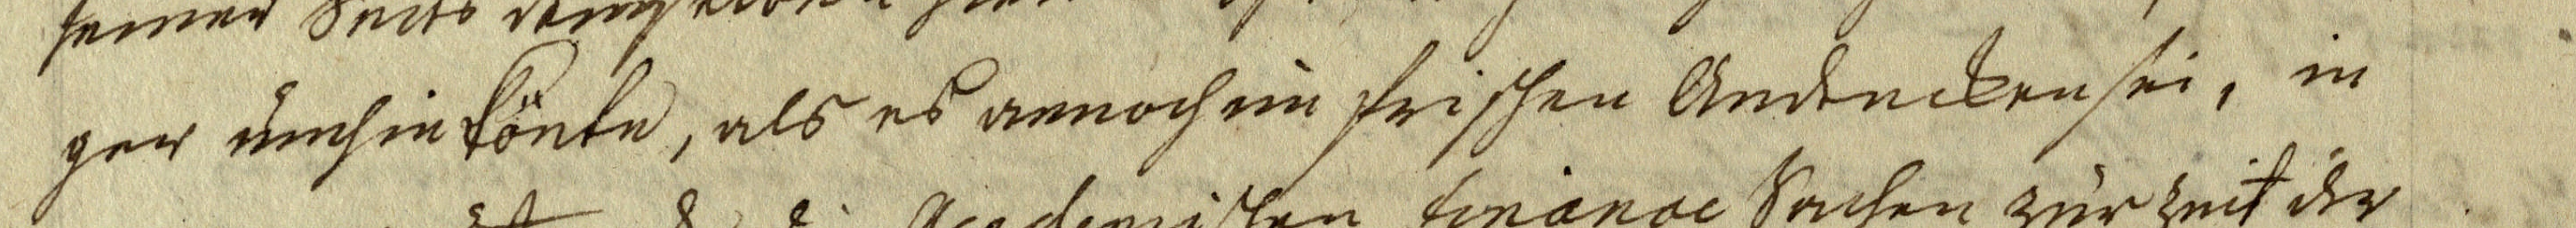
ger umhin könte, als es annoch im frischen Andenken sei, in
